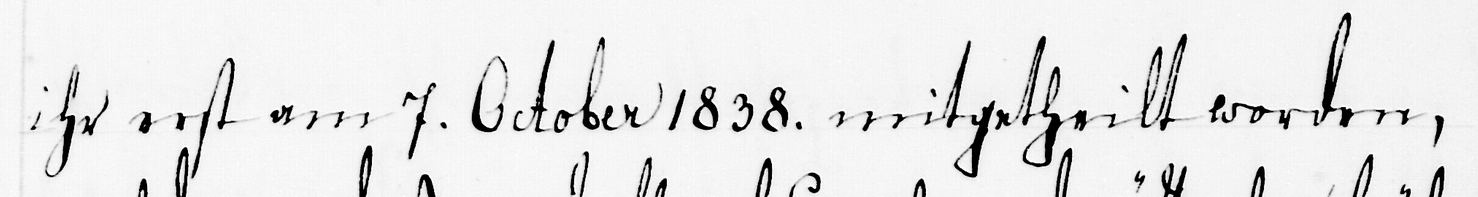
ihr erst am 7. October 1838. mitgetheilt worden,
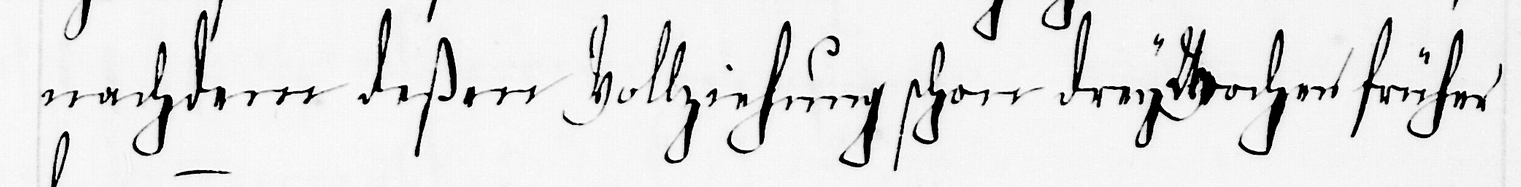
nachdem deßen Vollziehung schon drey Wochen früher
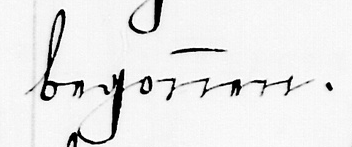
begonnen.
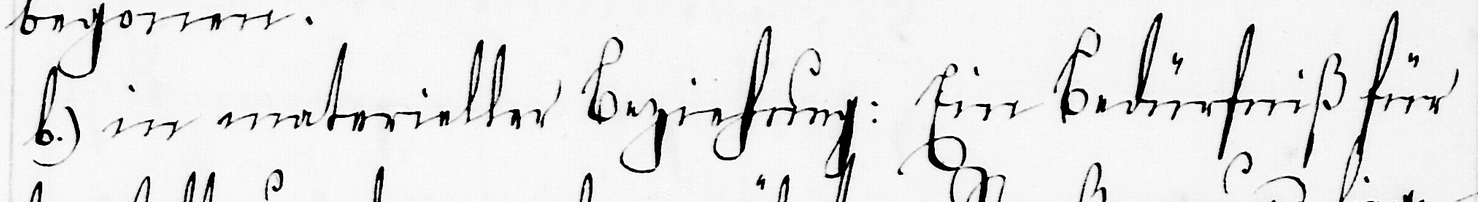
b.) in materieller Beziehung: Ein Bedürfniß für
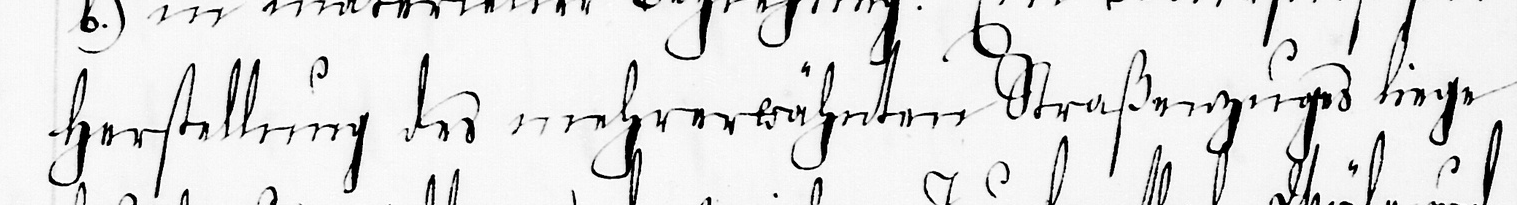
Herstellung des mehrerwähnten Straßenzuges liege
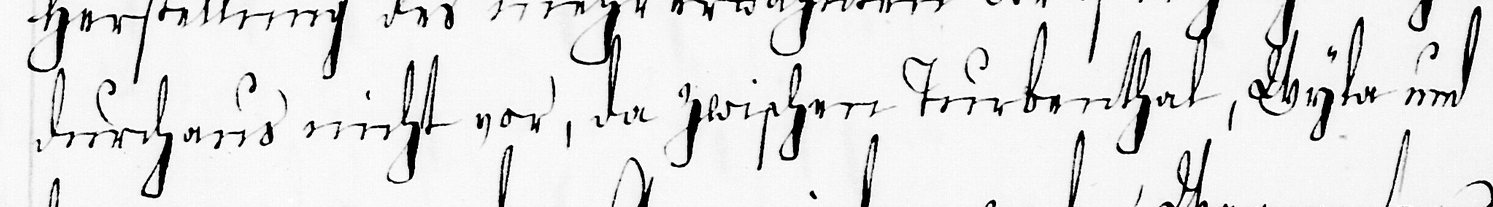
durchaus nicht vor, da zwischen Turbenthal, Wyla und
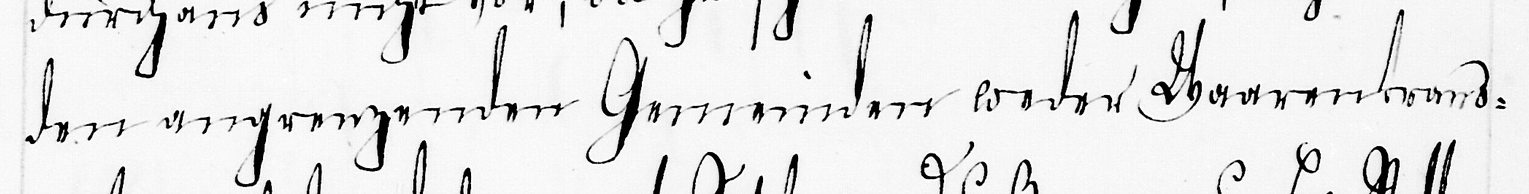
den angrenzenden Gemeinden weder Waarentrans¬
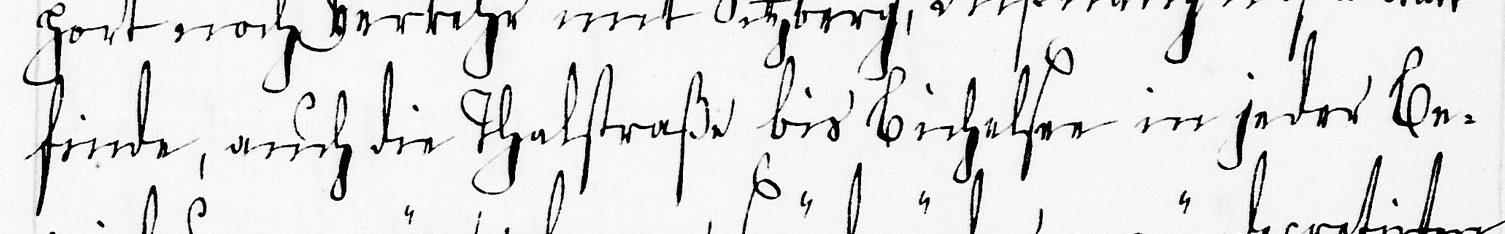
finde, ach die Thalstraße bis Bichelsee in jeder Be¬
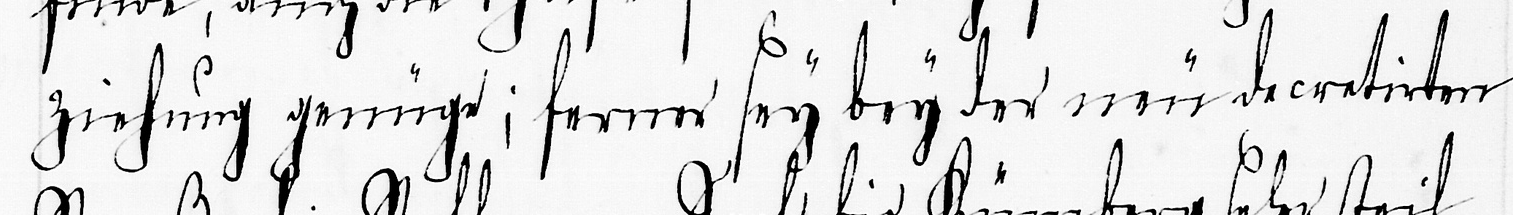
ziehung genüge; ferner sey bey der neu decretirten
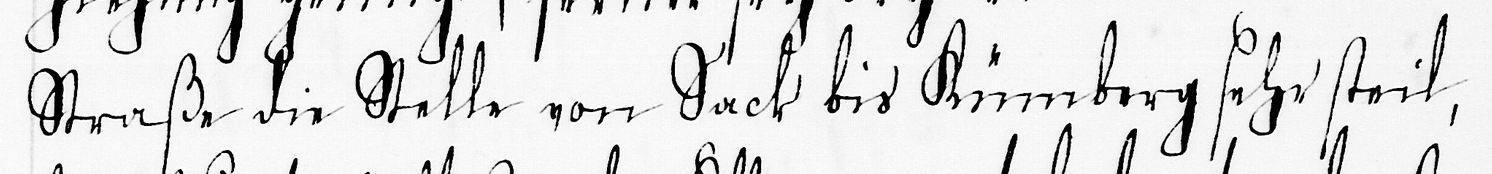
Straße die Stelle von Sack bis Kümberg sehr steil,
